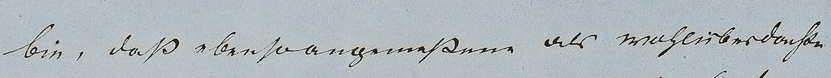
bin, daß ebenso angemeßene als wohlüberdachte
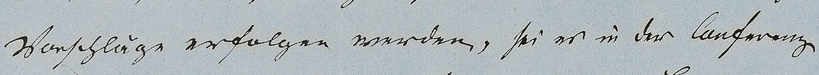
Vorschläge erfolgen werden, sei es in der Conferenz
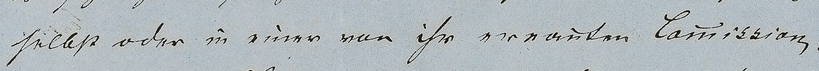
selbst oder in einer von ihr ernannten Commission.
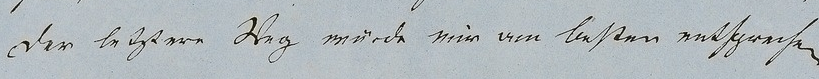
Der letztere Weg würde mir am besten entsprechen.
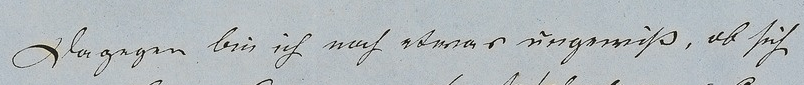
Dagegen bin ich noch etwas ungewiß, ob sich
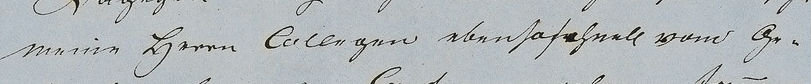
meine Herrn Collegen ebensoschnell vom Ge-
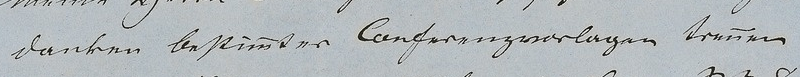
danken bestimmter Conferenzvorlagen trennen
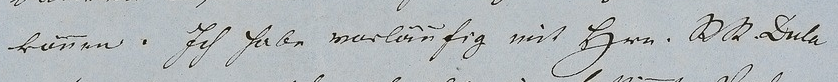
können. Ich habe vorläufig mit Hrn. RR. Dula
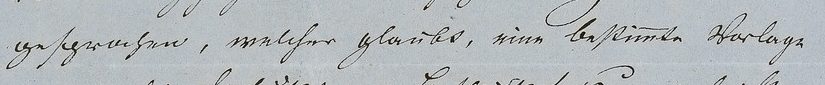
gesprochen, welcher glaubt, eine bestimmte Vorlage
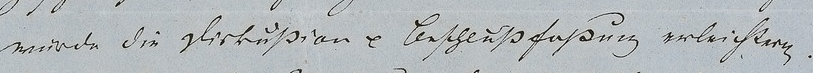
würde die Diskußion & Beschlußfaßung erleichtern.
